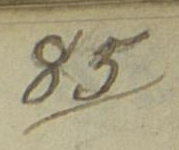85
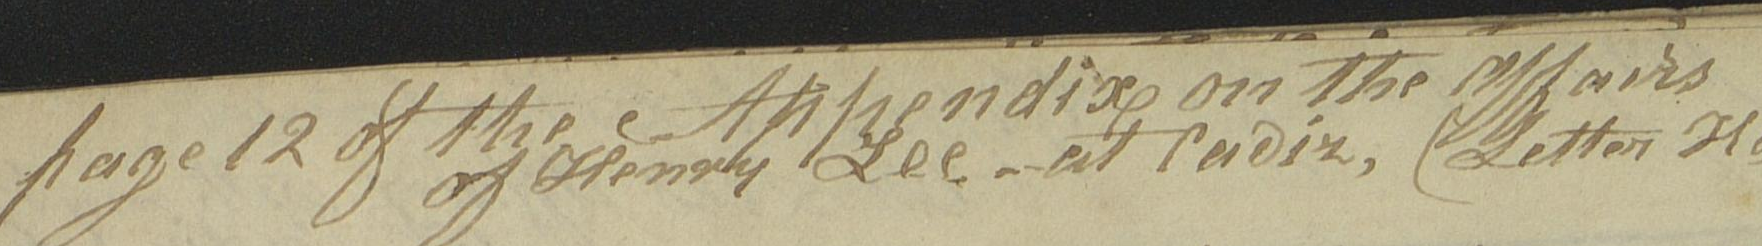page 12 of the Appendix on the Affairs
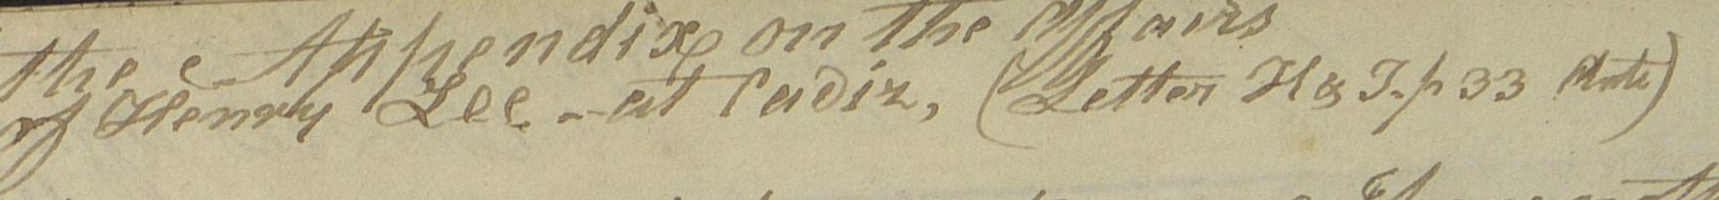of Henry Lee, at Cadiz (Letter H & J. p 33 Ante)
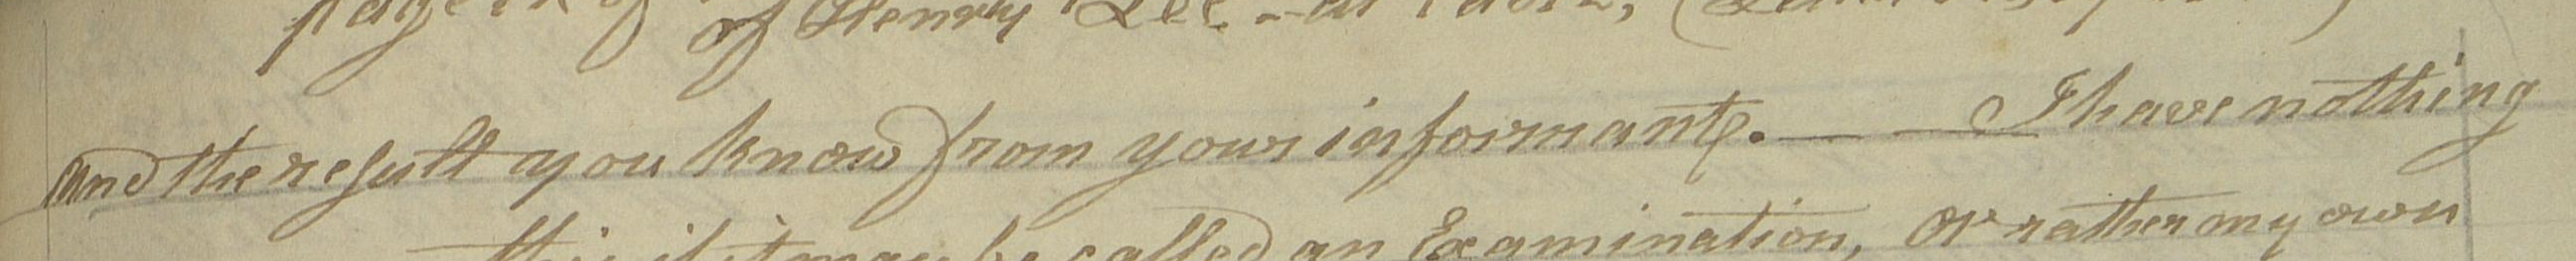and the result you know from your informant. I have nothing
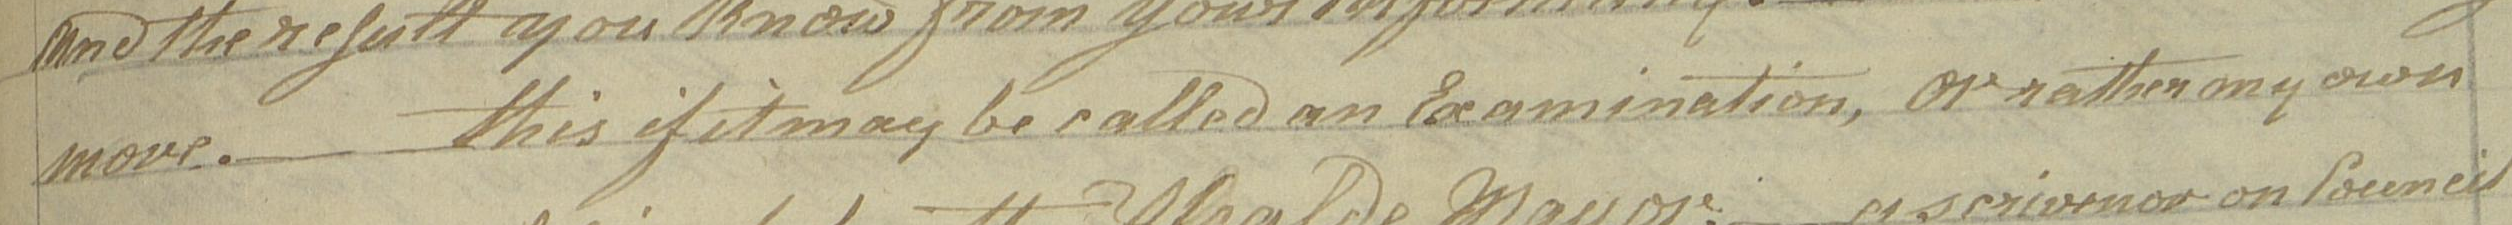move. This if it may be called an Examination, or rather my own
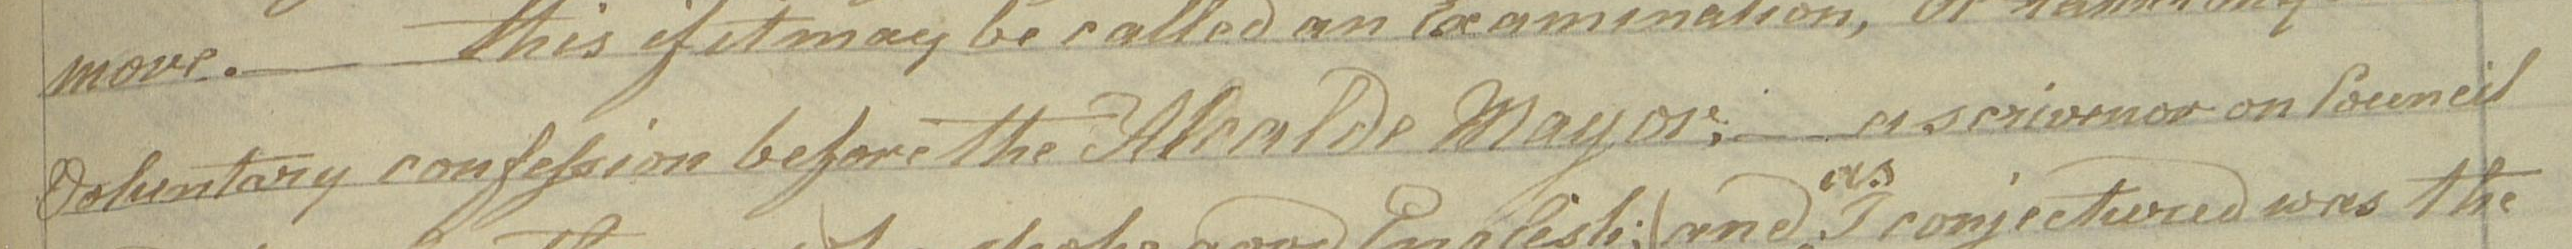Voluntary confession before the Alcalde Mayor: a scrivenor on Council
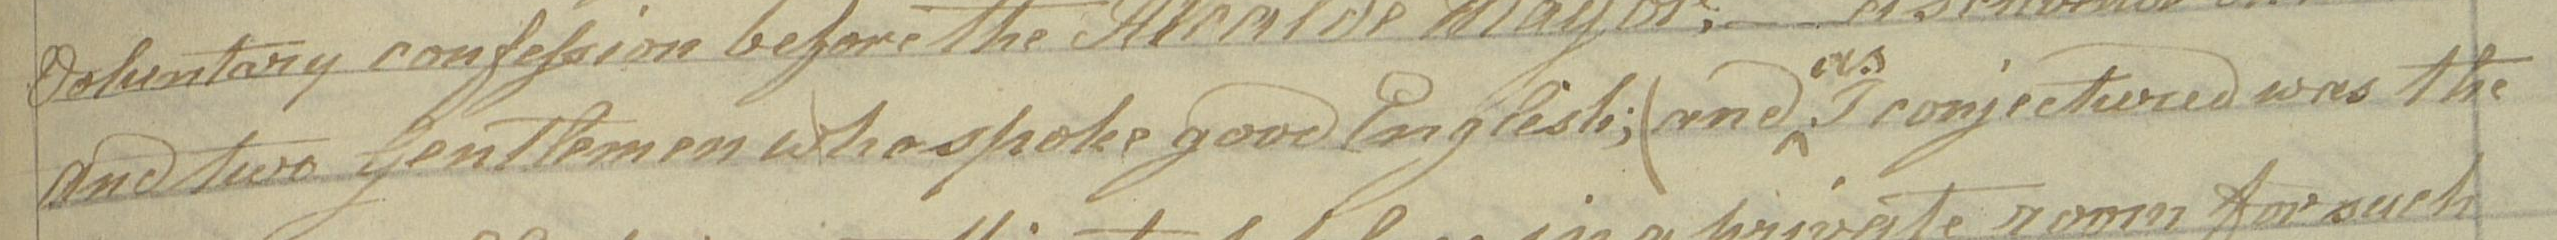and two Gentlemen who spoke good English; (and ^ I conjectured was the
